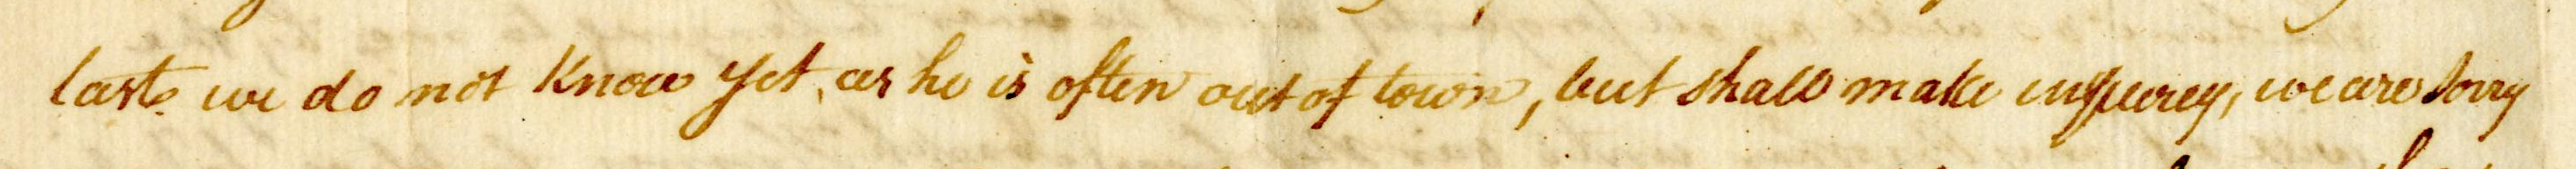last we do not know yet, as he is often out of town, but shall make inquiry, we are sorry
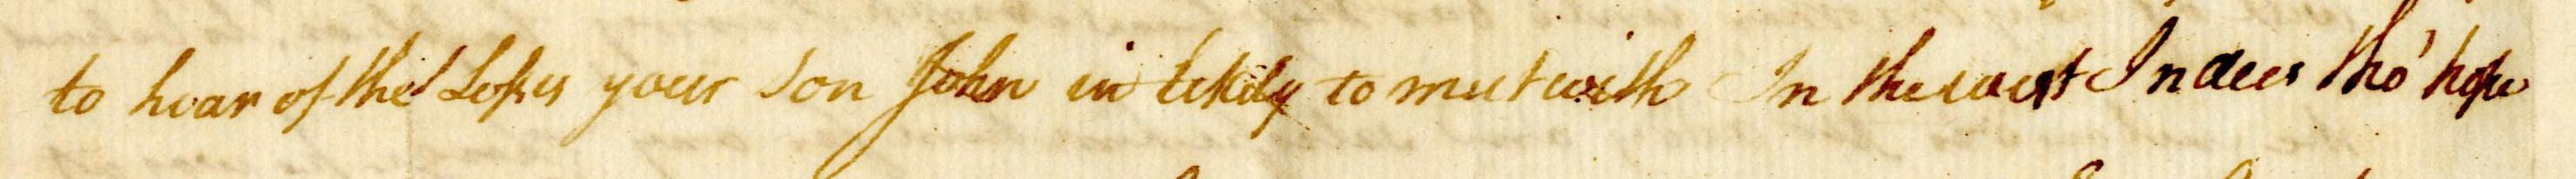to hear of the Losses your son John is likely to meet with In the west Indies tho' hope
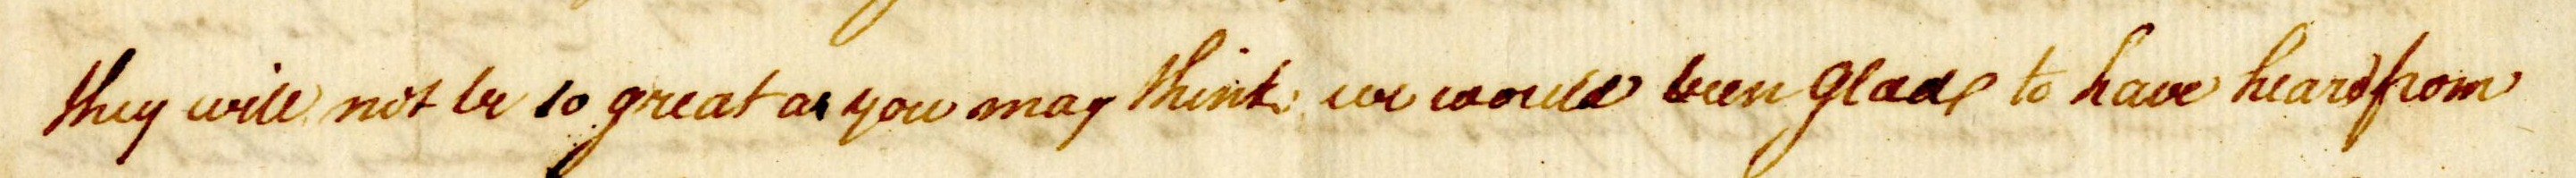they will not be so great as you may think we would been glad to have heard from
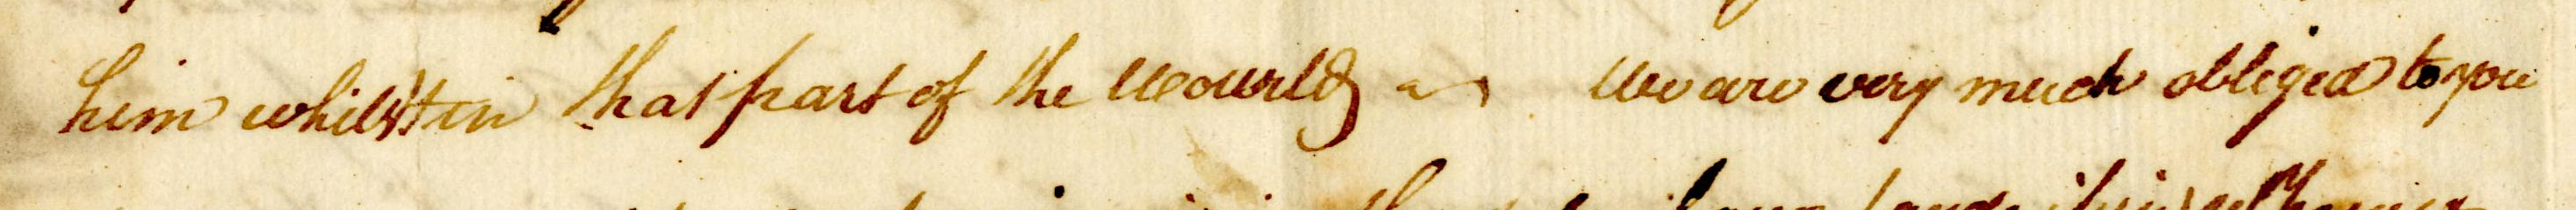him whilst in that part of the wourld- We are very much obliged to you
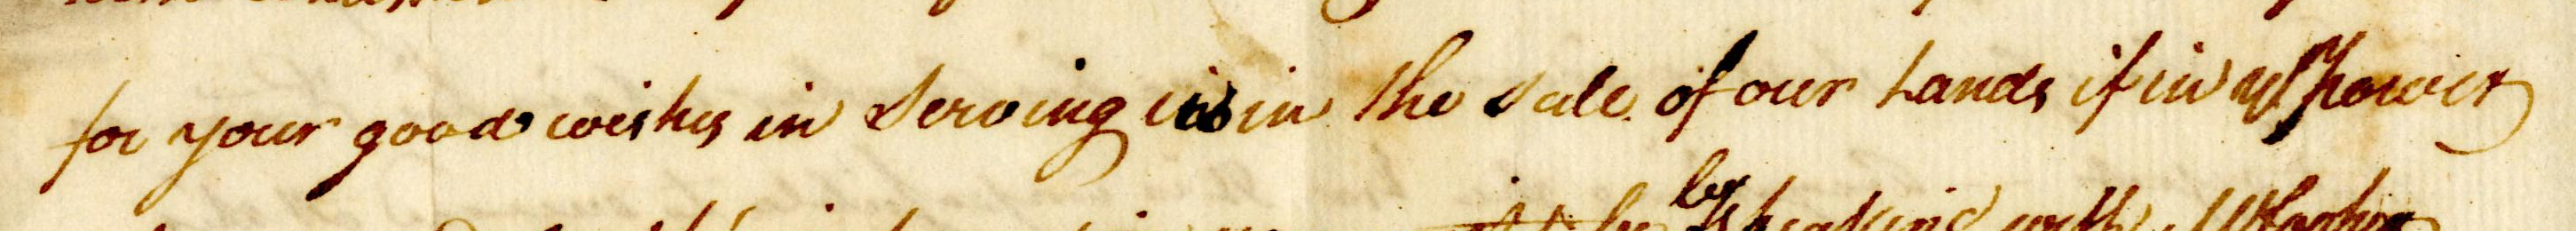for your good wishes in Serving us in the sale of our Lands if in y^r power,
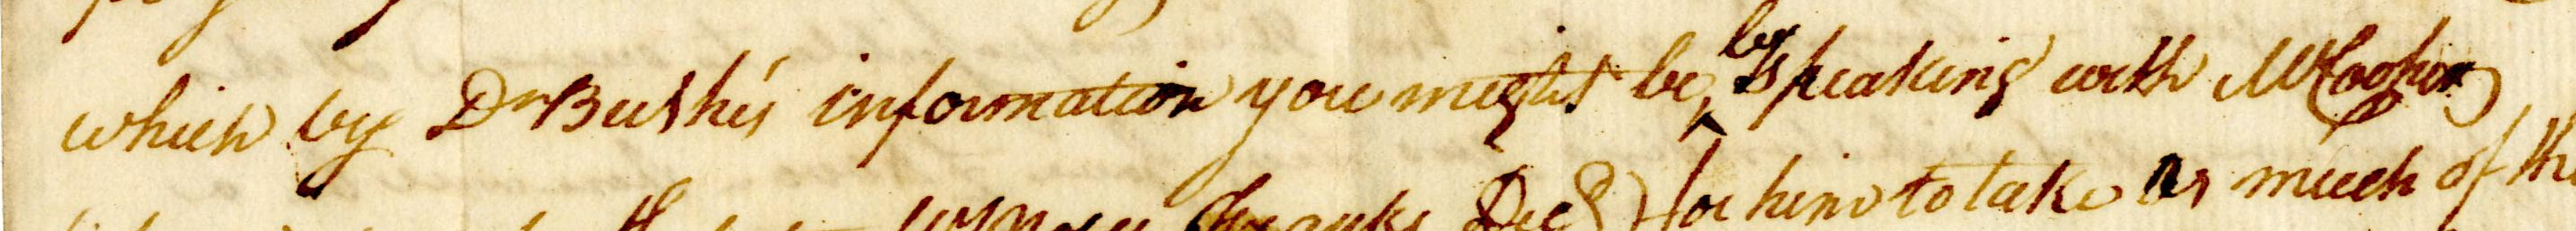which by D^r Bushe's information you might be ^by Speaking with M^r Cooper
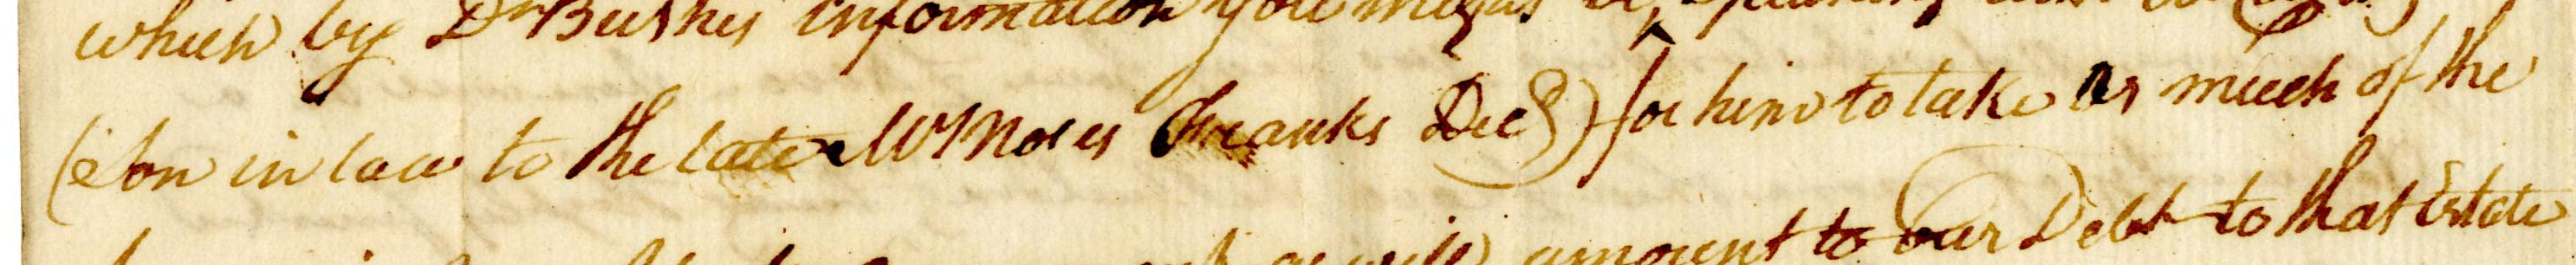(Inclosed to the late M^r Moses Franks Deed) for him to take as much of the
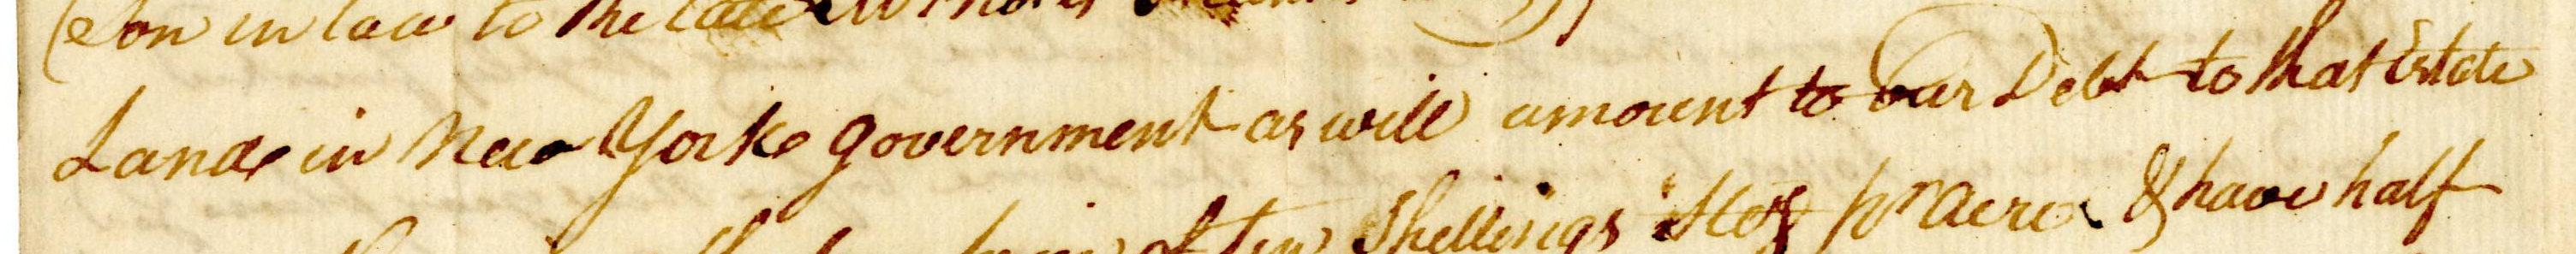Land in New York government as will amount to our Debt to that Estate
